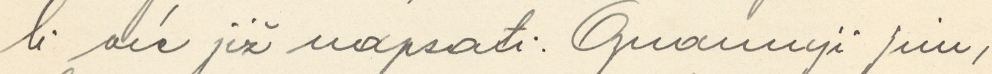li víc již napsati. Oznamuji jim,
